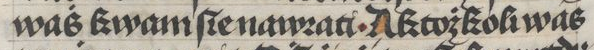waṡ kwam ſie nawrati.Aktożkoli was
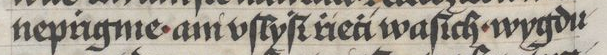nepṙigme.ani vſlyẛi ṙieċí waſích.wygdu¬
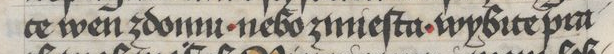te wen zdomu.nebo zmieſta.wybite pra¬
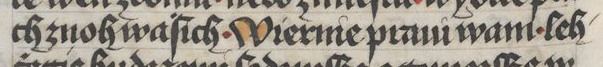ch znoh waẛich.Wiernie praui wam.leh¬
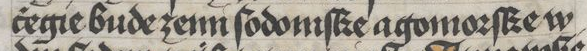ċegíe bude zemi ſodomſke a gomorſke w
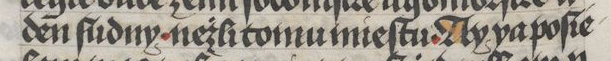den ſudny.neżli tomu mieſtu.Ay ya poſie¬
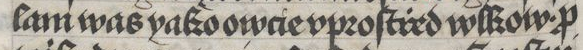lam was yako owcie vproſtṙed wlkow.ꝑ¬
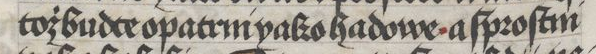toż budte opatrni yako hladowe.a ſproſtni
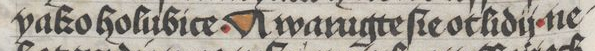yako holubice.A warugte ſie ot lidij.ne¬
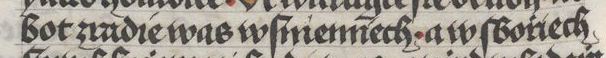bot zradíe was wſiníech.a w ſboṙíech
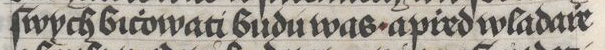ſwych biċowati budu was.a pṙed wladaṙe
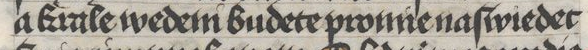a krale wedeni budete promie naſwiedec¬
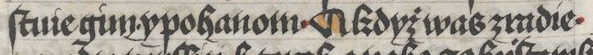ſtuie gim.ypohanom.A kdyż was zradie.
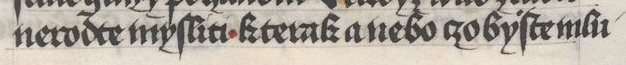nerodte myſliti.kterak a nebo czo byẛte mlu¬
